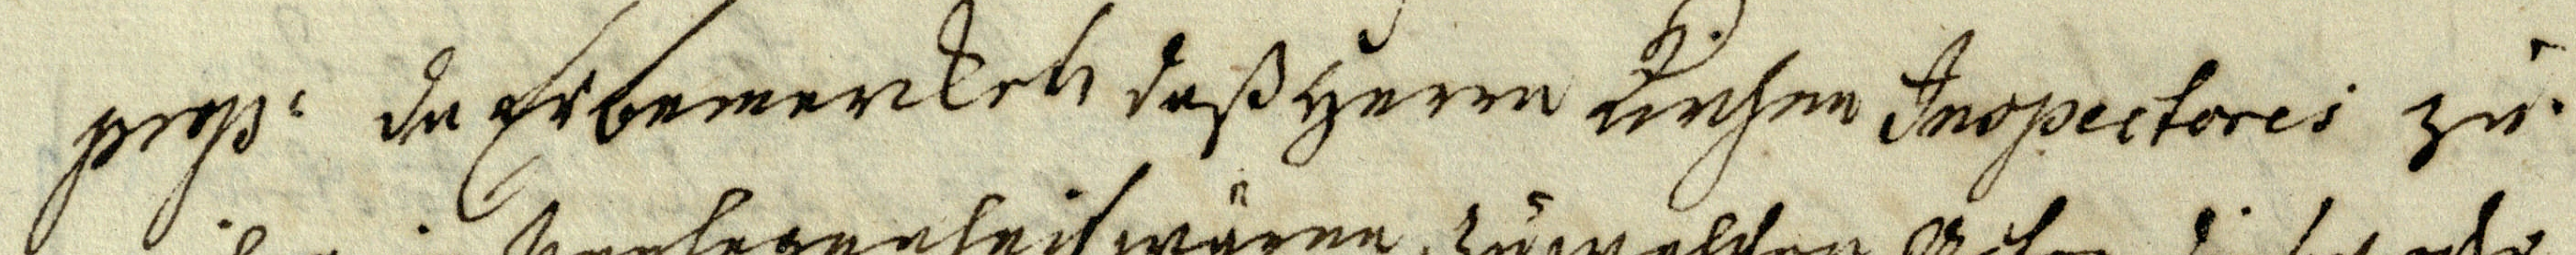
prop da Er bemercket, daß Herrn Kirchen Inspectores zu¬
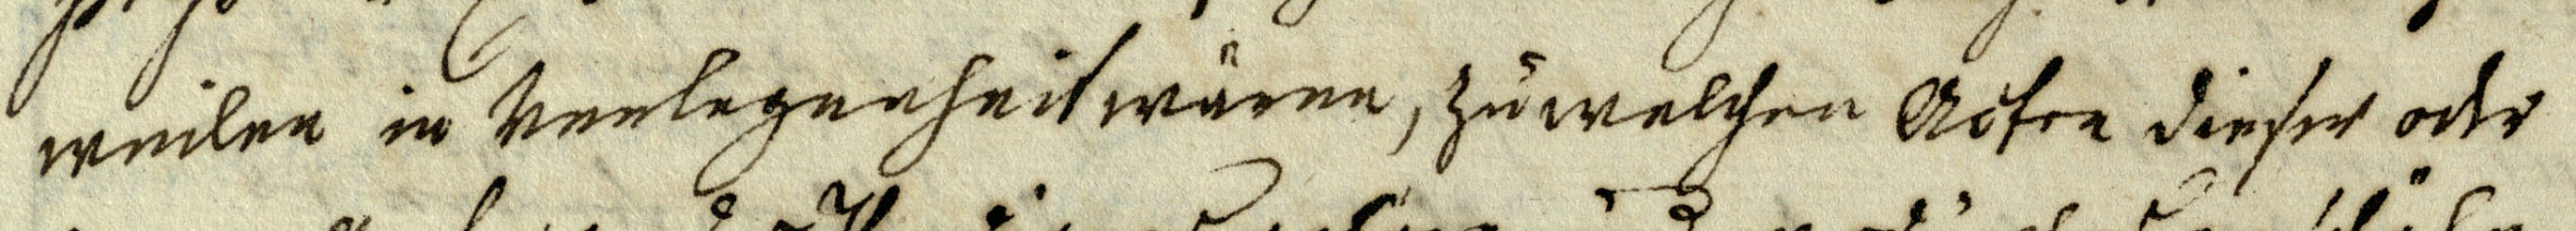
weilen in Verlegenheit wäre, zu welchen Acten dieser oder
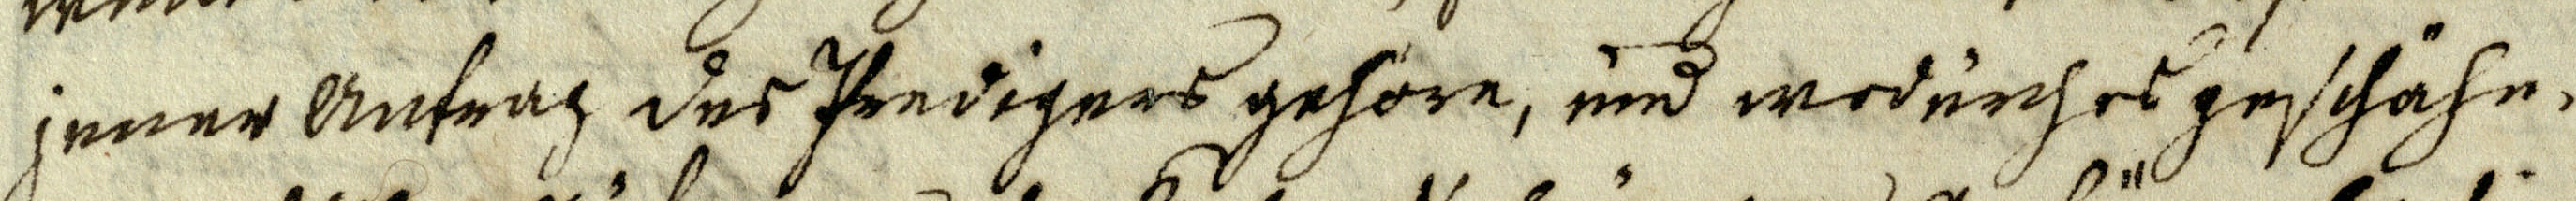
jener Antrag des Predigers gehöre, und wodurch es geschähe,
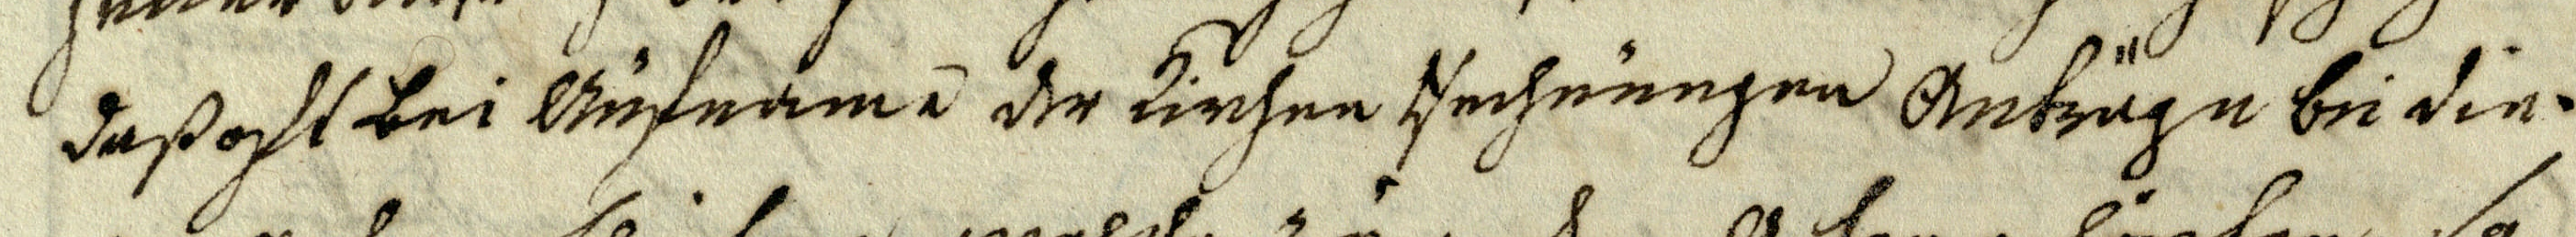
daß oft bei Aufnahme der Kirchen Rechnungen Anträge bei die¬
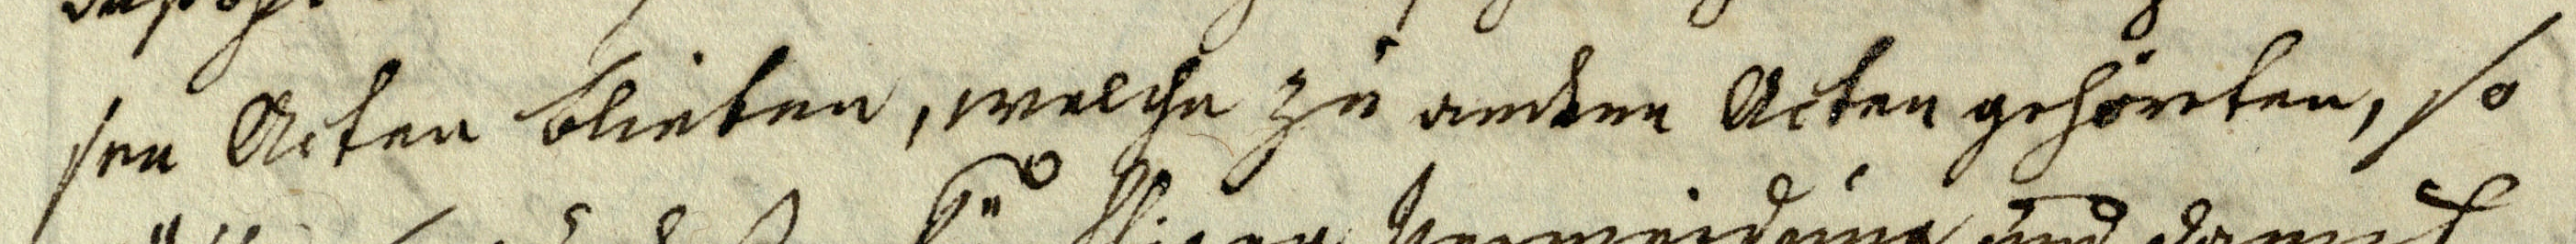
sen Acten blieben, welche zu andern Acten gehörten, so
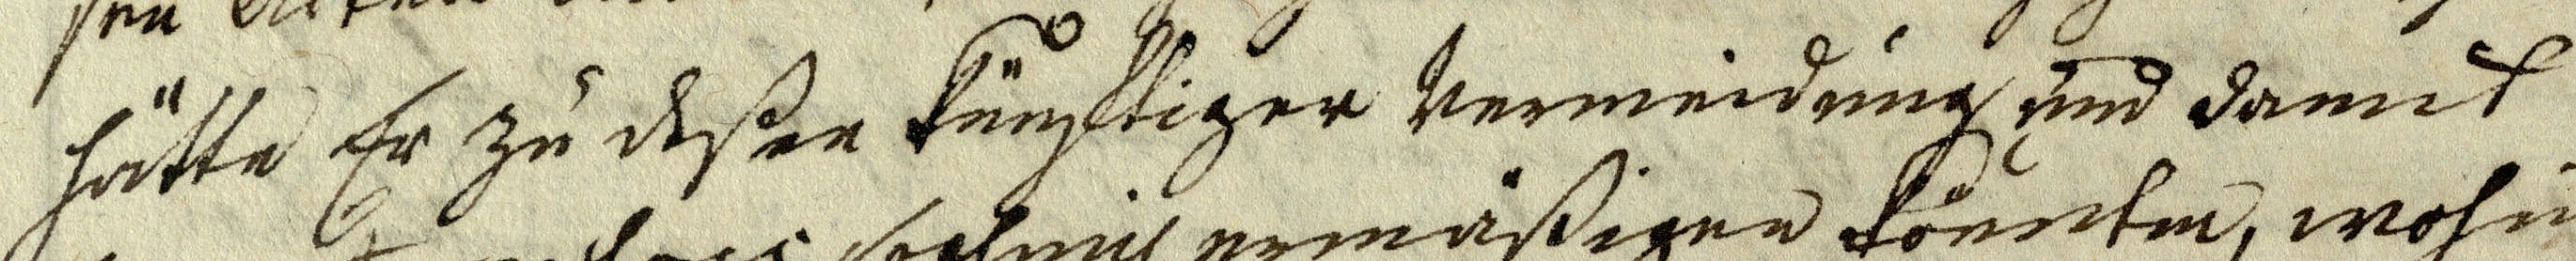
hätte Er zu deßen künftiger Vermeidung und damit
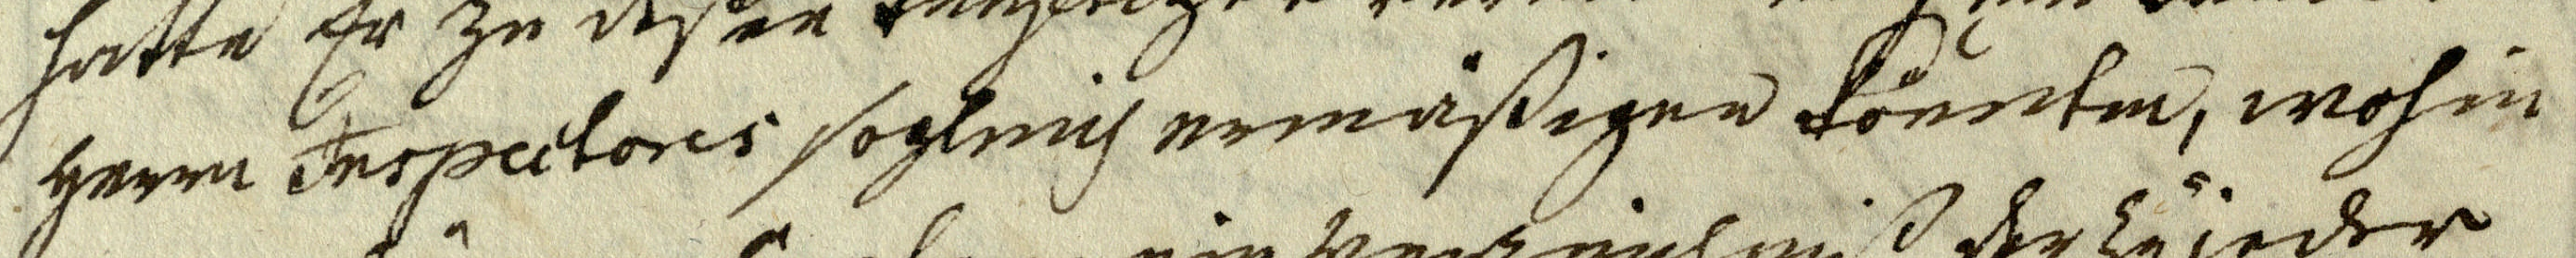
Herrn Inspectores sogleich ermäßigen könnten, wohin
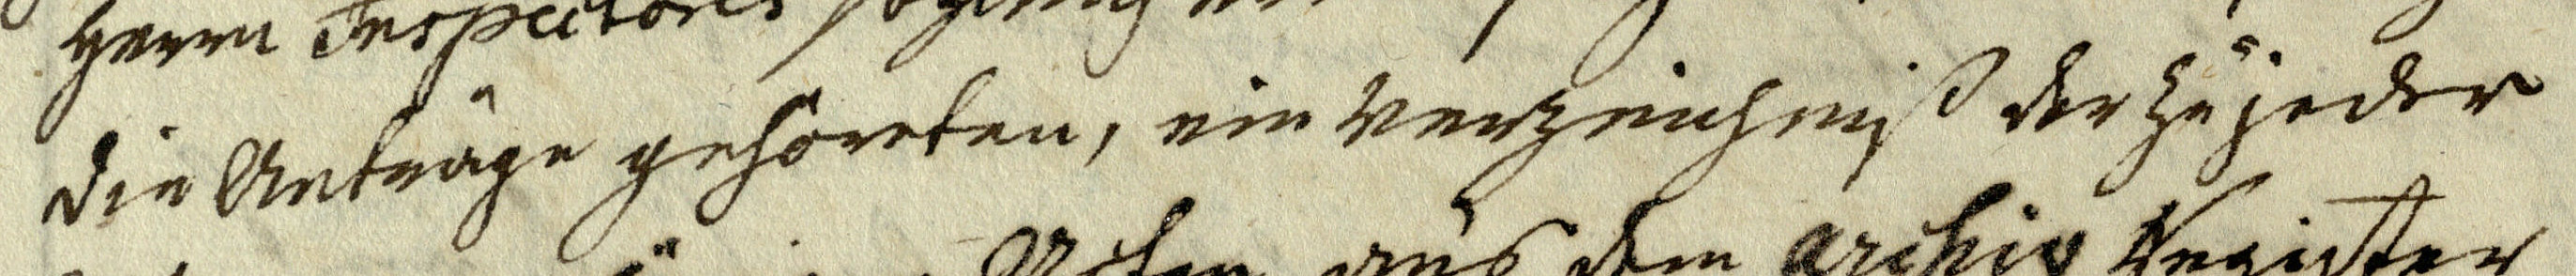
die Anträge gehöreten, ein Verzeichniß der zu jeder
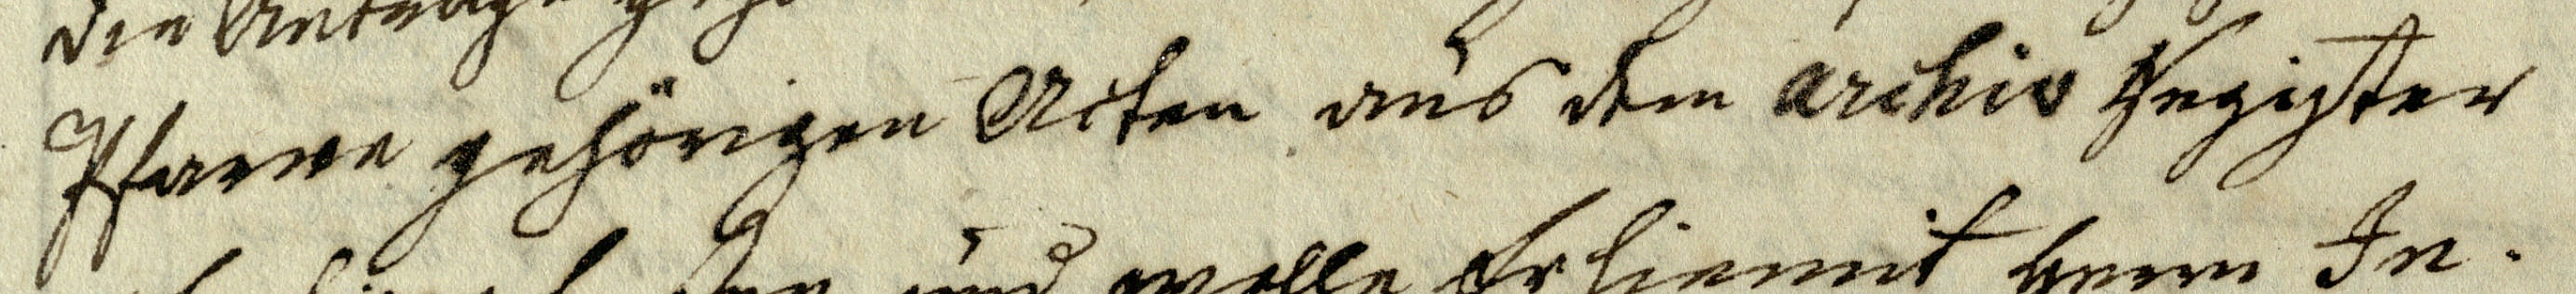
Pfarre gehörigen Acten aus dem Archiv Register
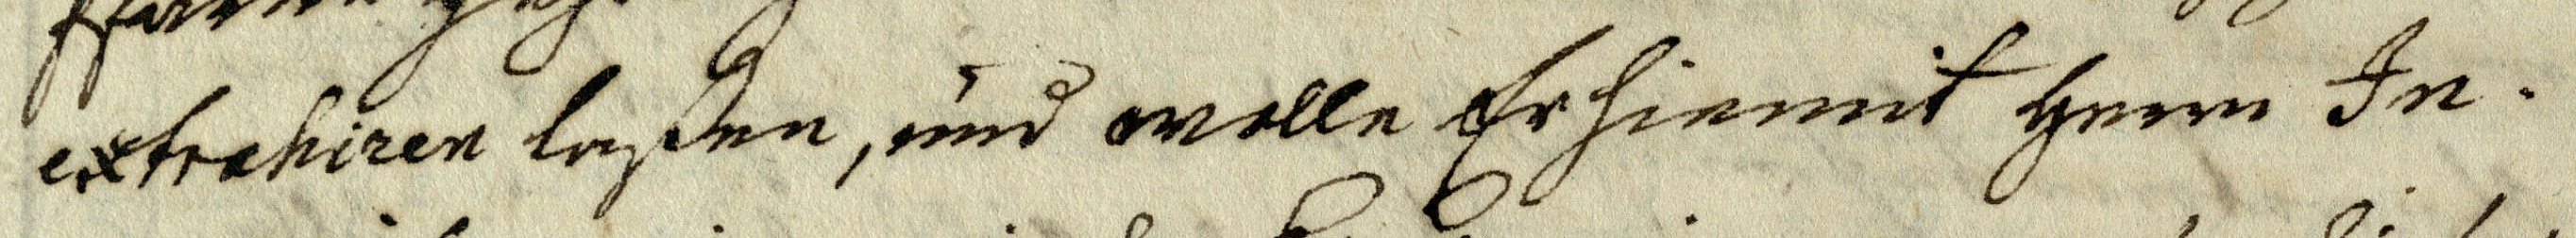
extrahiren laßen, und wolle Er hiemit Herrn In¬
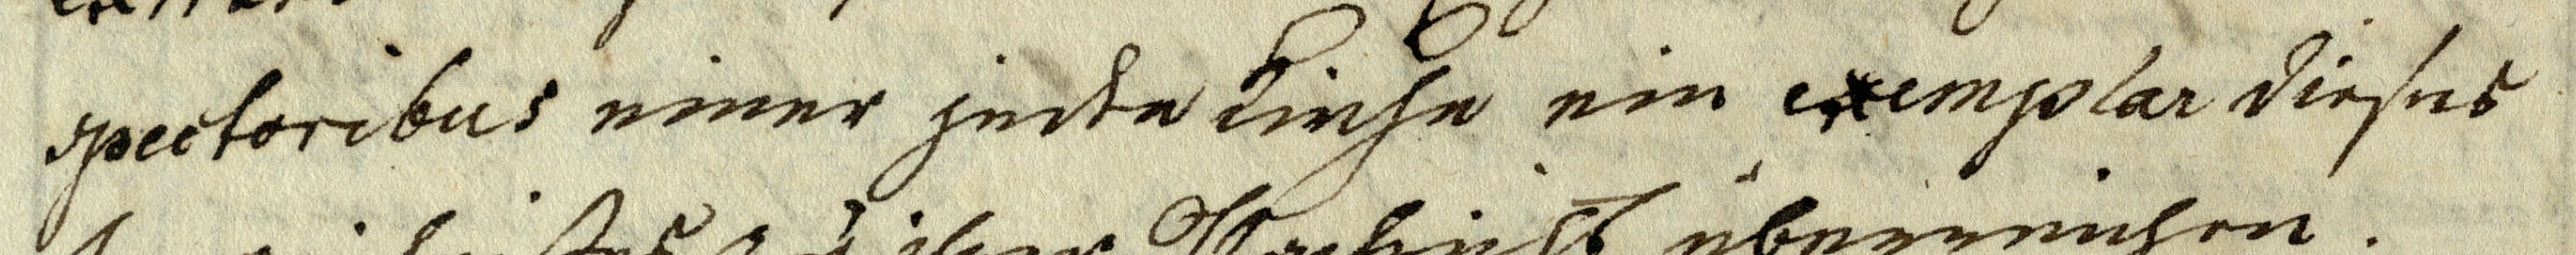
spectoribus einer jeden Kirche ein Exemplar dieses
